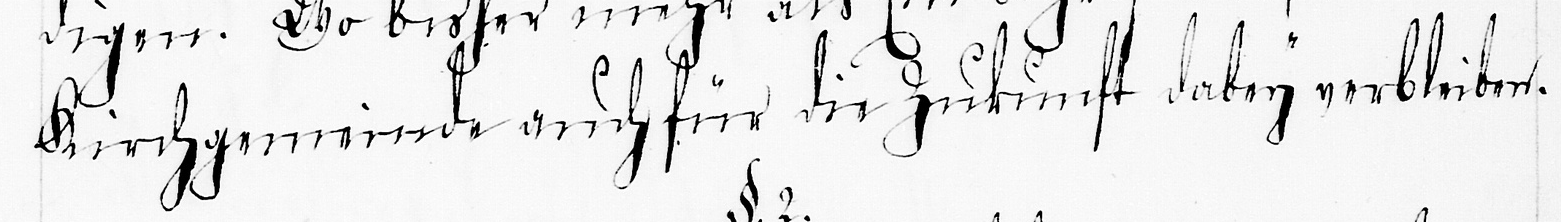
Kirchgemeinde auch für die Zukunft dabey verbleiben.
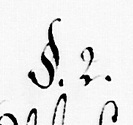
§. 2.
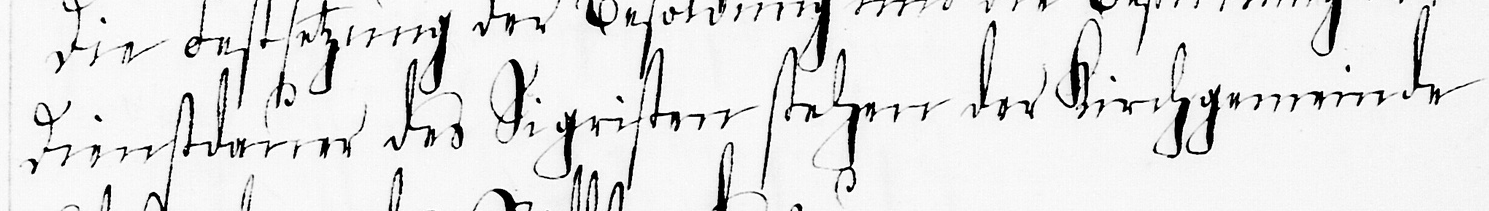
Dienstdauer des Sigristen stehen der Kirchgemeinde
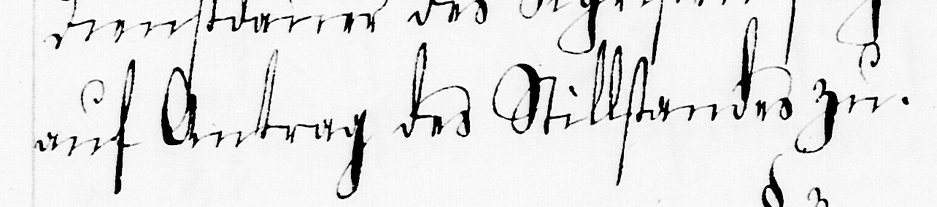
auf Antrag des Stillstandes zu.
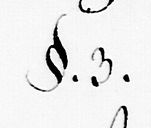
§. 3.
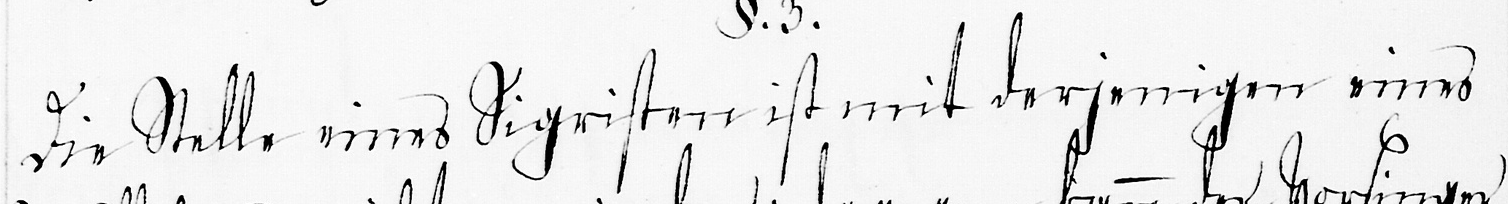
Die Stelle eines Sigristen ist mit derjenigen eines
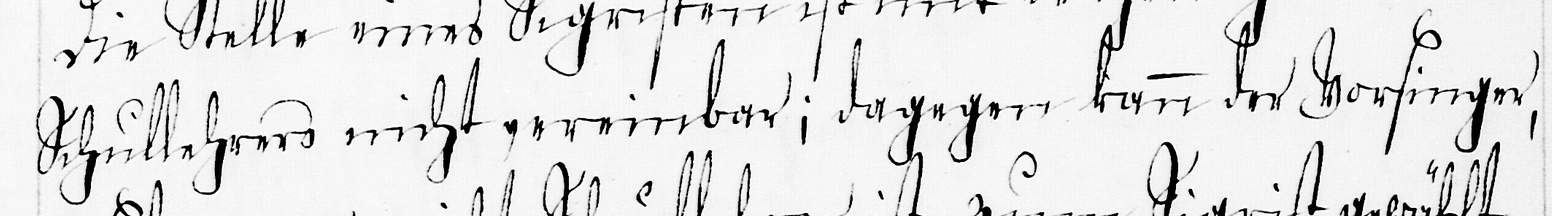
Schullehrers nicht vereinbar; dagegen kann der Vorsinger,
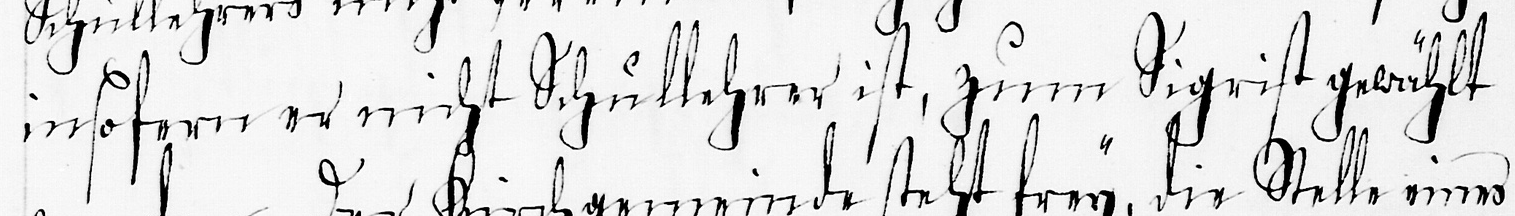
insofern er nicht Schullehrer ist, zum Sigrist gewählt
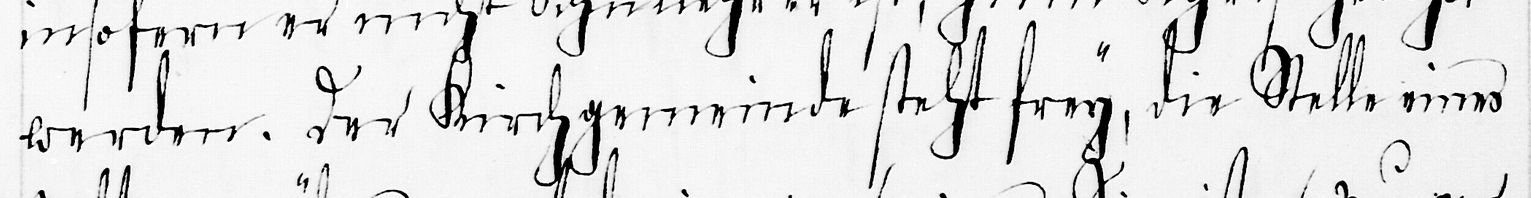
werden. Der Kirchgemeinde steht frey, die Stelle eines
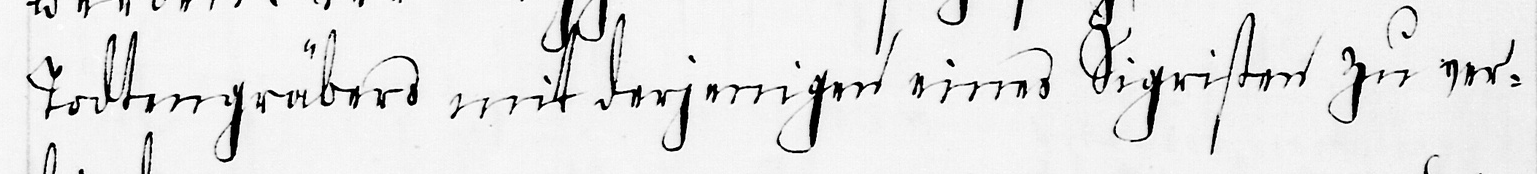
Todtengräbers mit derjenigen eines Sigristen zu ver¬
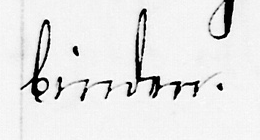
binden.
